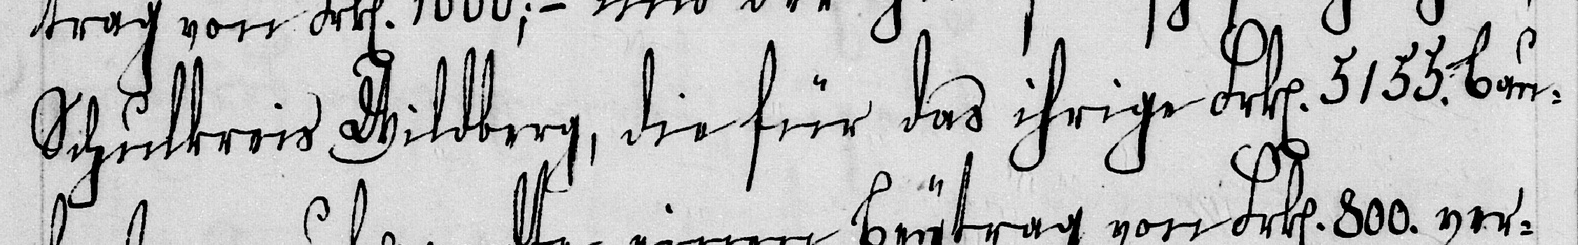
Schulkreis Wildberg, die für das ihrige Frk[en].
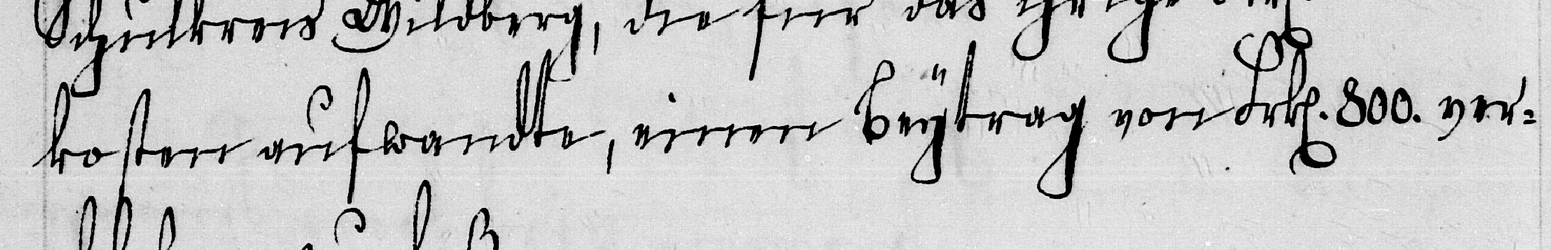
kosten aufwandte, einen Beytrag von Frk[en]. 800. ver¬
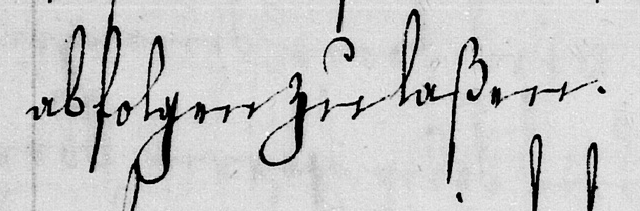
abfolgen zu laßen.
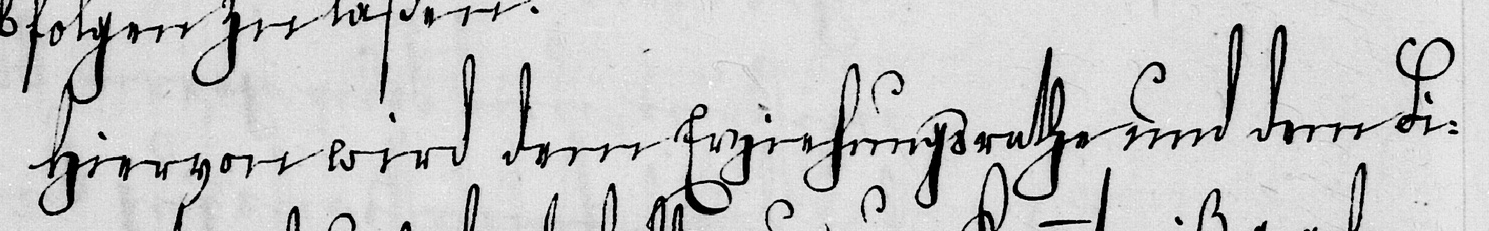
Hiervon wird dem Erziehungsrathe und dem Fi¬
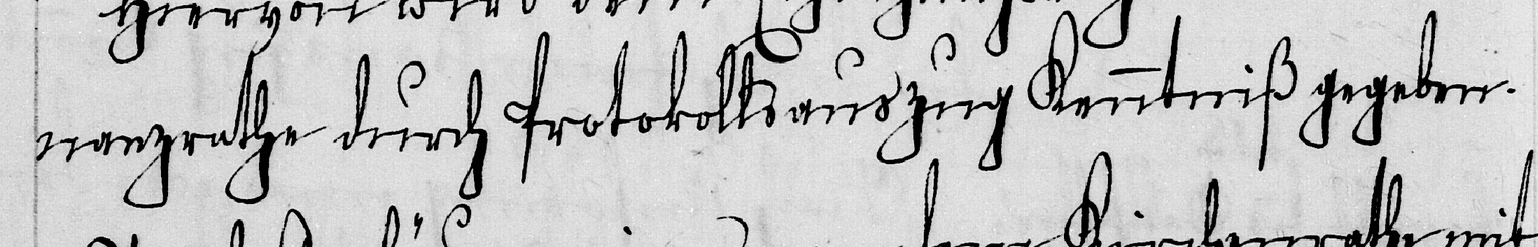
nanzrathe durch Protokollsauszug Kenntniß gegeben.
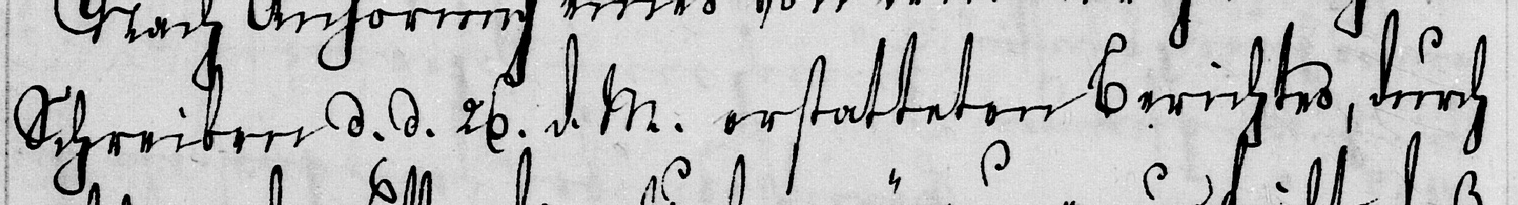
Schreiben d. d. 26. d. M. erstatteten Berichtes, durch
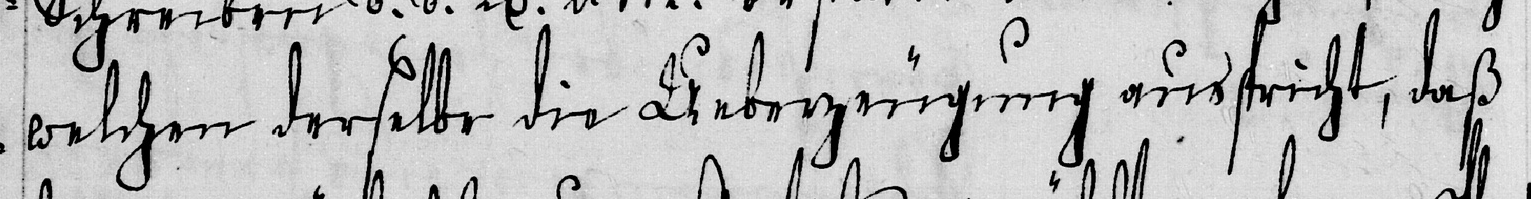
welchen derselbe die Ueberzeugung ausspricht, daß
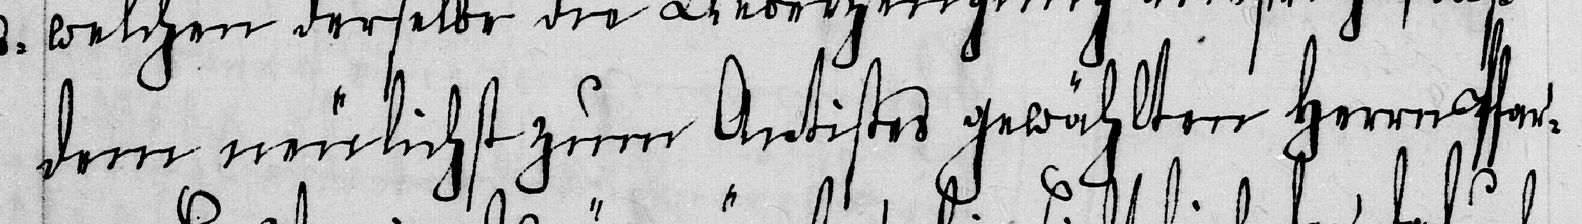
dem neulichst zum Antistes gewählten Herrn Pfar¬
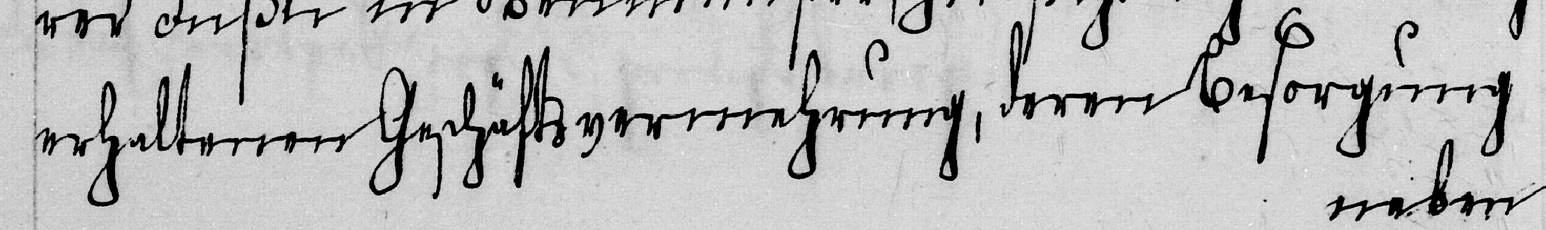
erhaltenen Geschäftsvermehrung, deren Besorgung
